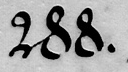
20.
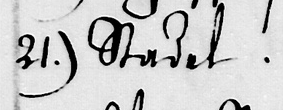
21.) Stadel
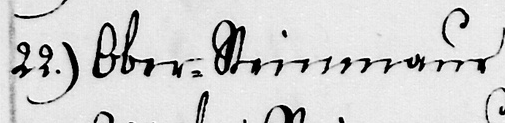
22.) Ober-Steinmaur
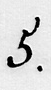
35.
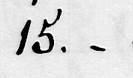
13.
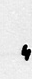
4.
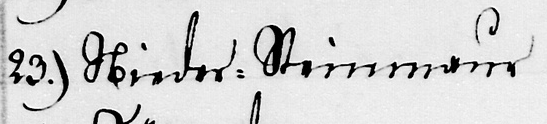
23.) Nieder-Steinmaur
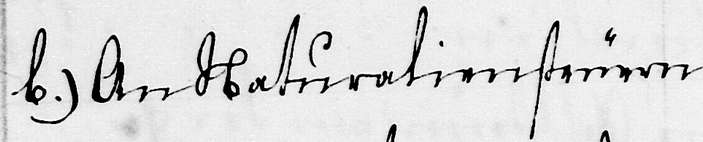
b.) An Naturaliensteuern
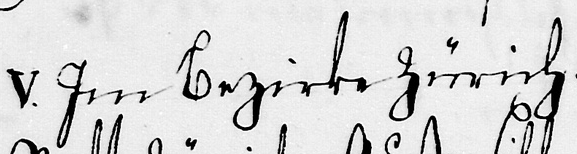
V. Im Bezirke Zürich.
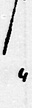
.
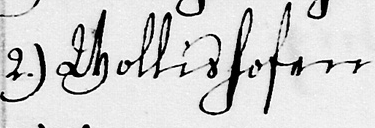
2.) Wollishofen
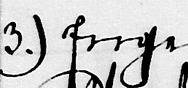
3.) Enge
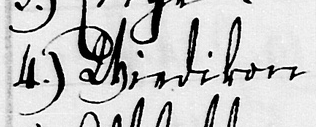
4.) Wiedikon
